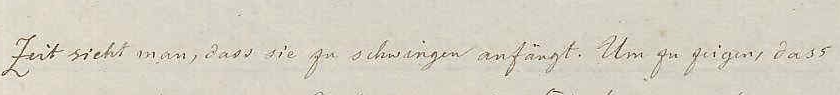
Zeit sieht man, dass sie zu schwingen anfängt. Um zu zeigen, dass
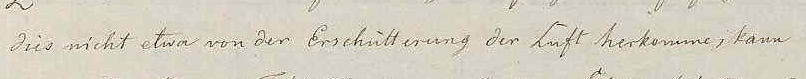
dies nicht etwa von der Erschütterung der Luft herkomme, kann
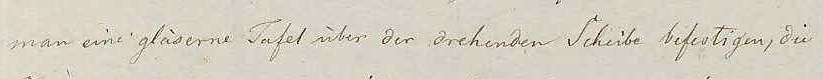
man eine gläserne Tafel über der drehenden Scheibe befestigen, die
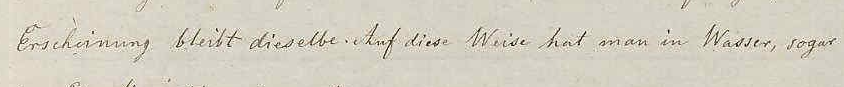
Erscheinung bleibt dieselbe. Auf diese Weise hat man in Wasser, sogar
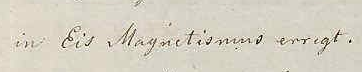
in Eis Magnetismus erregt.
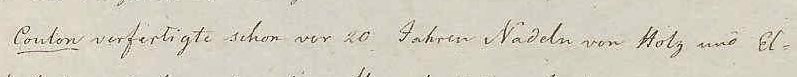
Coulon verfertigte schon vor 20 Jahren Nadeln von Holz und El-
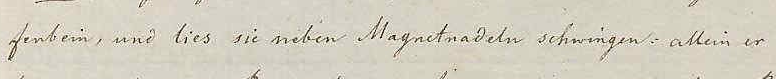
fenbein, und lies sie neben Magnetnadeln schwingen: allein er
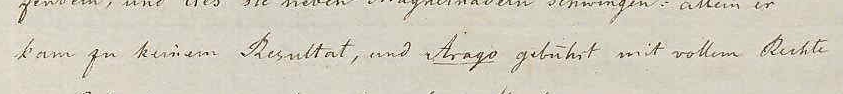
kam zu keinem Resultat, und Arago gebührt mit vollem Rechte
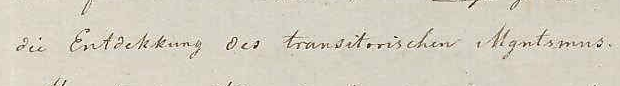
die Entdekkung des transitorischen Mgntsmus.
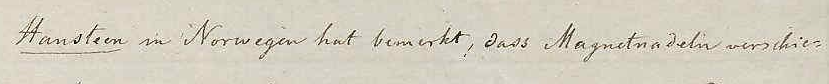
Hansteen in Norwegen hat bemerkt, dass Magnetnadeln verschie-
